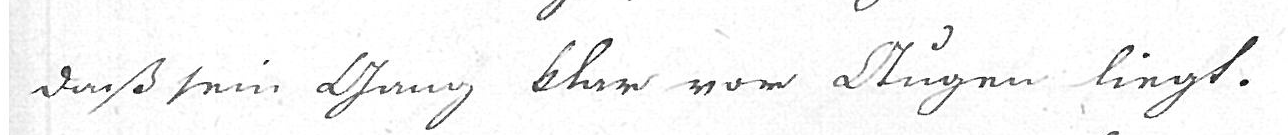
daß sein Gang klar vor Augen liegt.
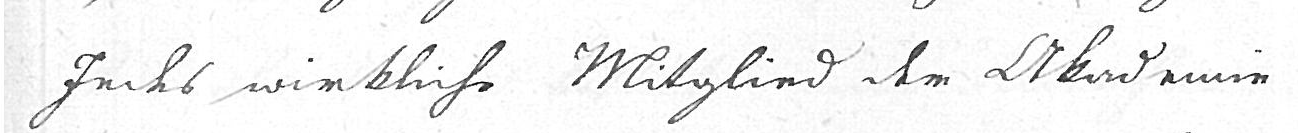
Jedes wirkliche Mitglied der Akademie
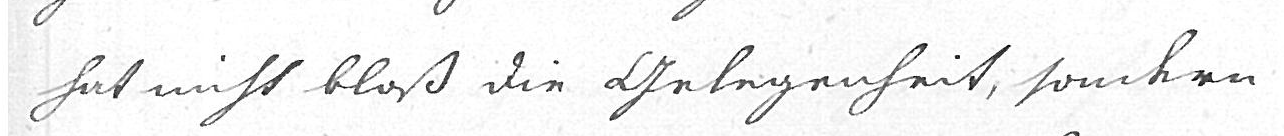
hat nicht bloß die Gelegenheit, sondern
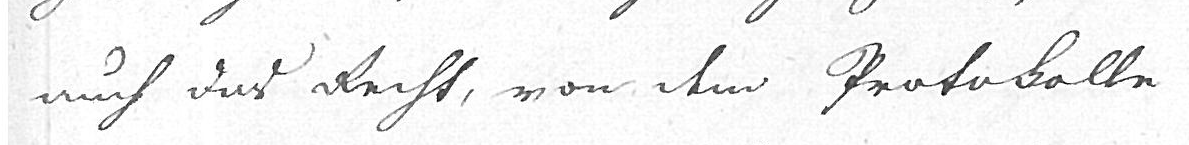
auch das Recht, von dem Protokolle
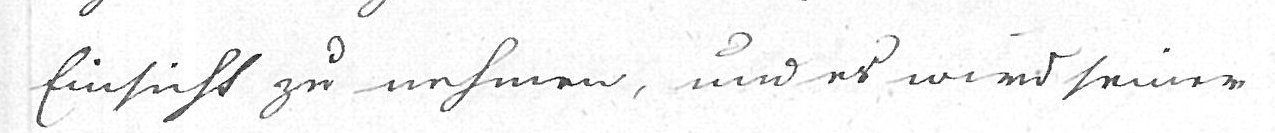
Einsicht zu nehmen, und es wird seiner
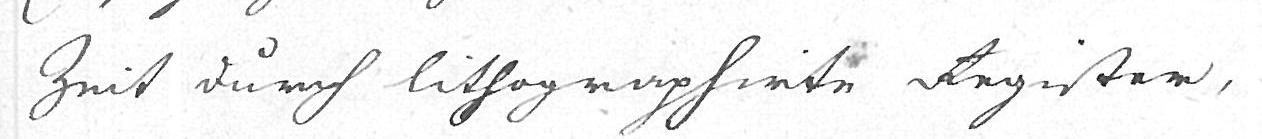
Zeit durch lithographirte Register,
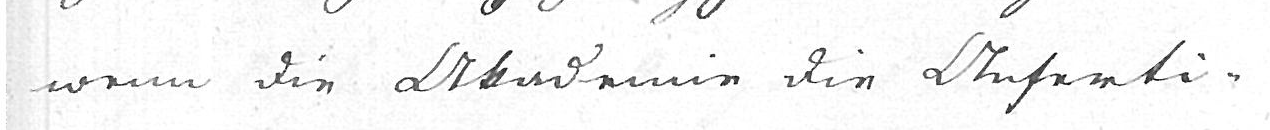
wenn die Akademie die Anferti-
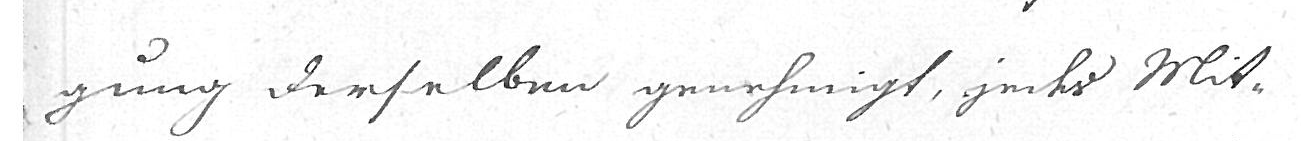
gung derselben genehmigt, jedes Mit-
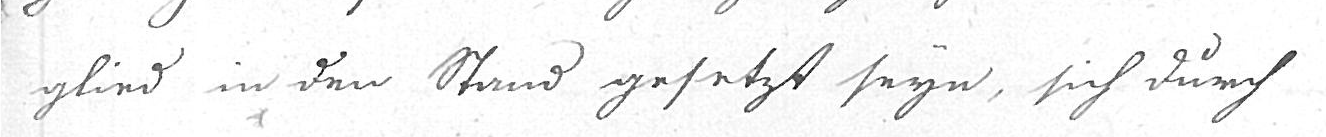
glied in den Stand gesetzt seyn, sich durch
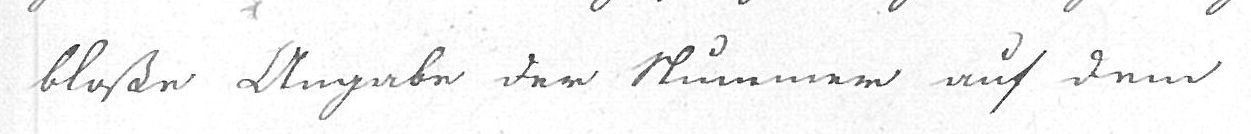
bloße Angabe der Nummer auf dem
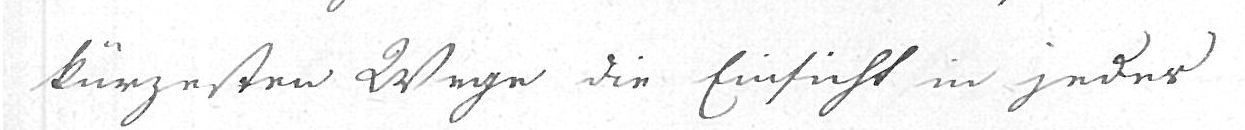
kürzesten Wege die Einsicht in jedes
